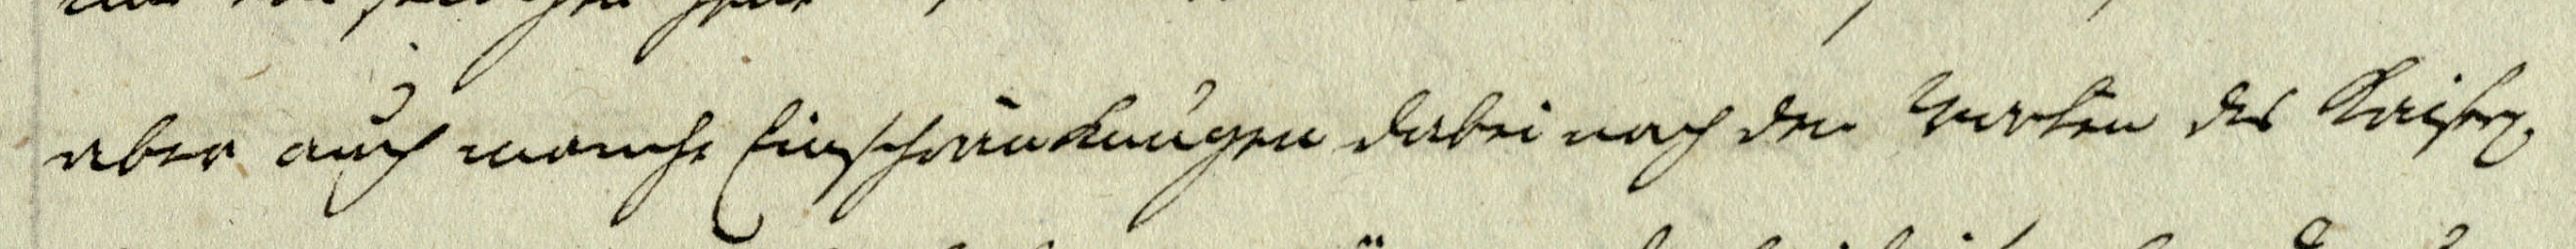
aber auch manche Einschränkungen dabei nach den Worten des Kaiser.
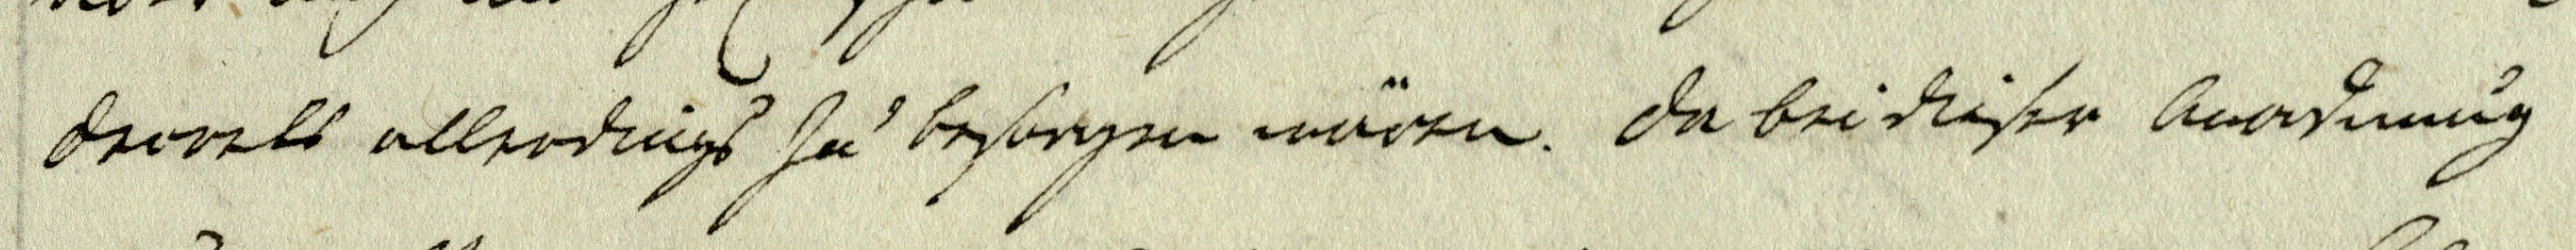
Decrets allerdings zu besorgen wären. Da bei dieser Anordnung
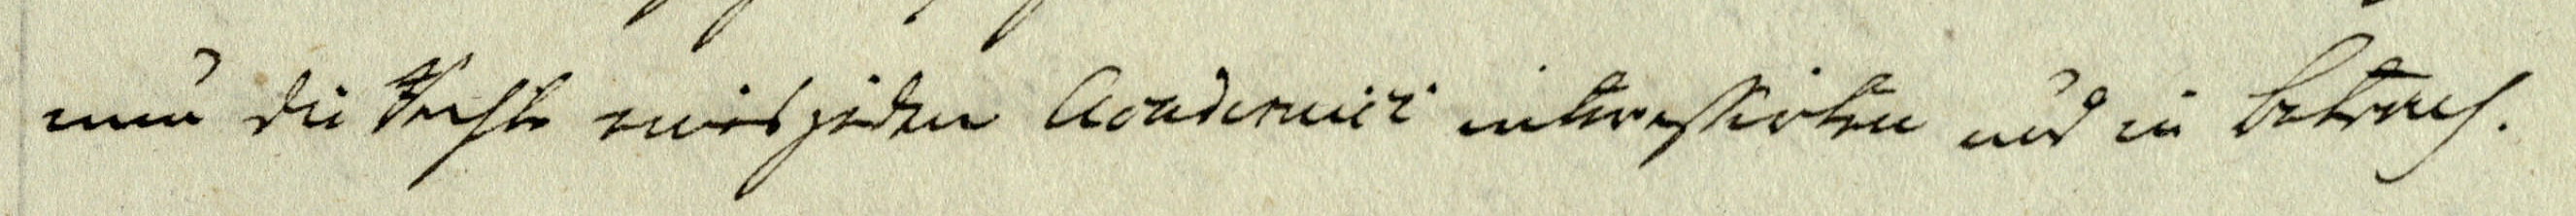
nun die Rechte eines jeden Academici interessirten und in Betrach¬
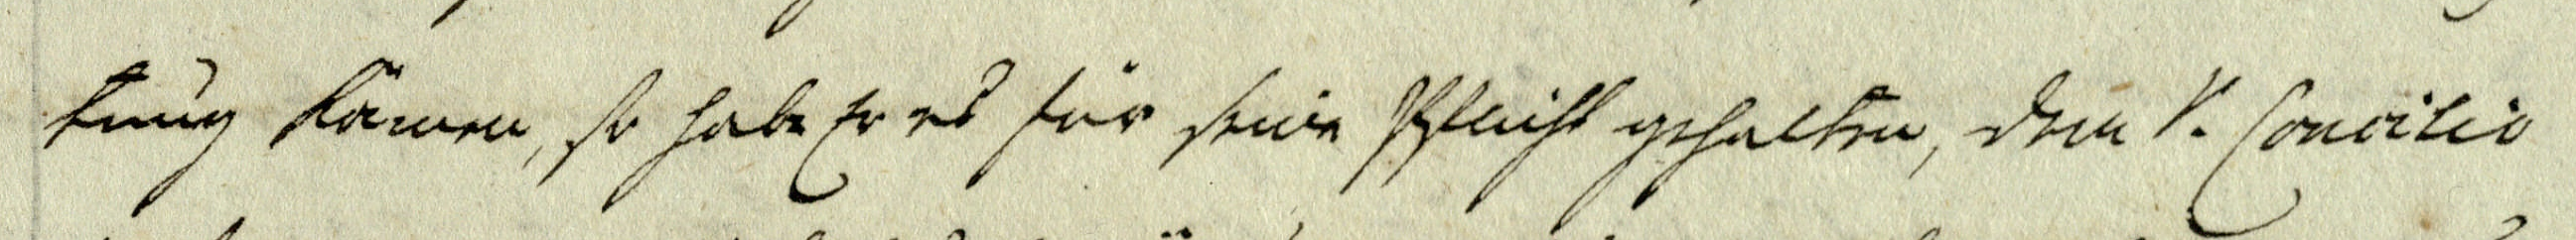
tung kämen, so habe Er es für seine Pflicht gehalten, dem V. Concilio
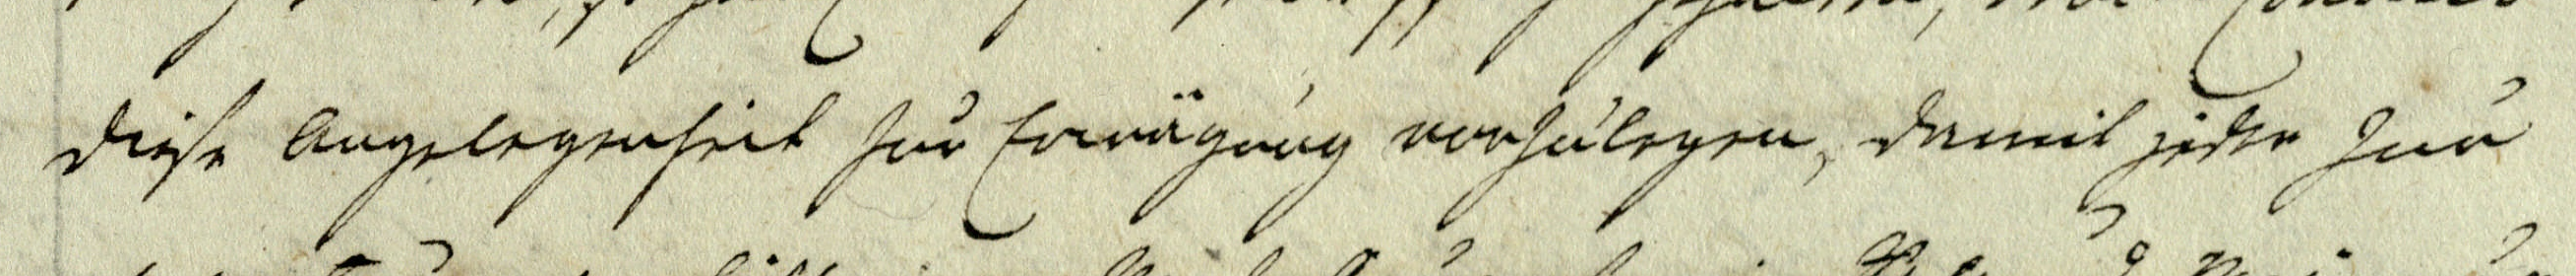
diese Angelegenheit zur Erwägung vorzulegen, damit jeder zur
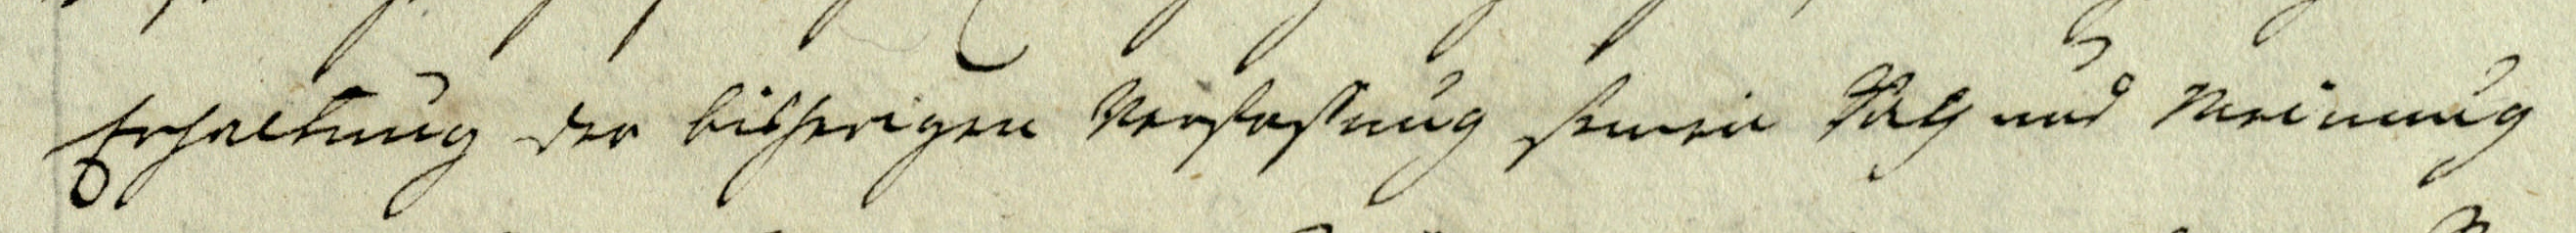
Erhaltung der bisherigen Verfassung seinen Rath und Meinung
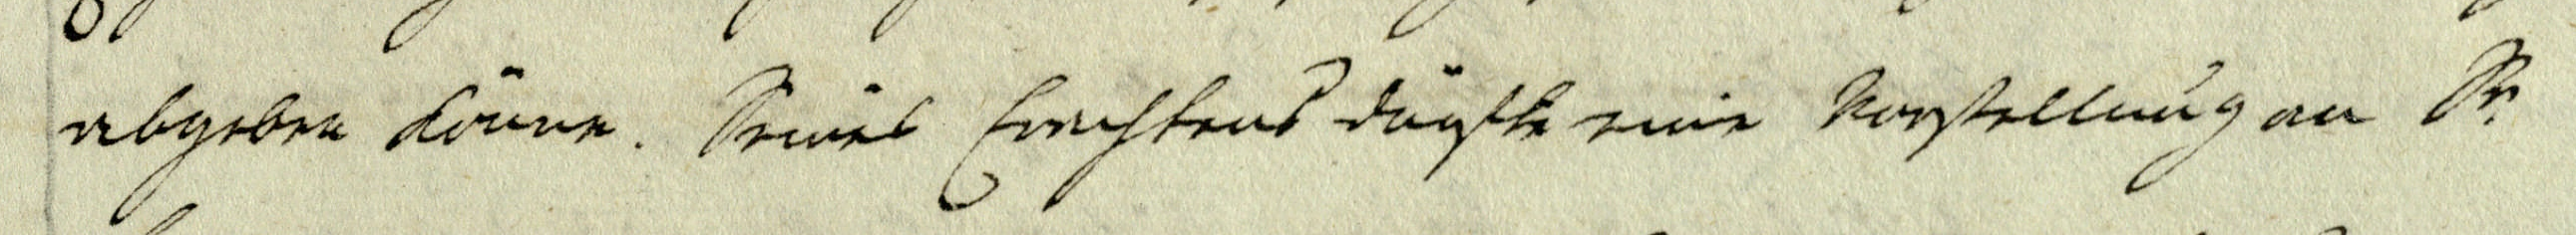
abgeben könne. Seines Erachtens dürfte eine Vorstellung an Sr.
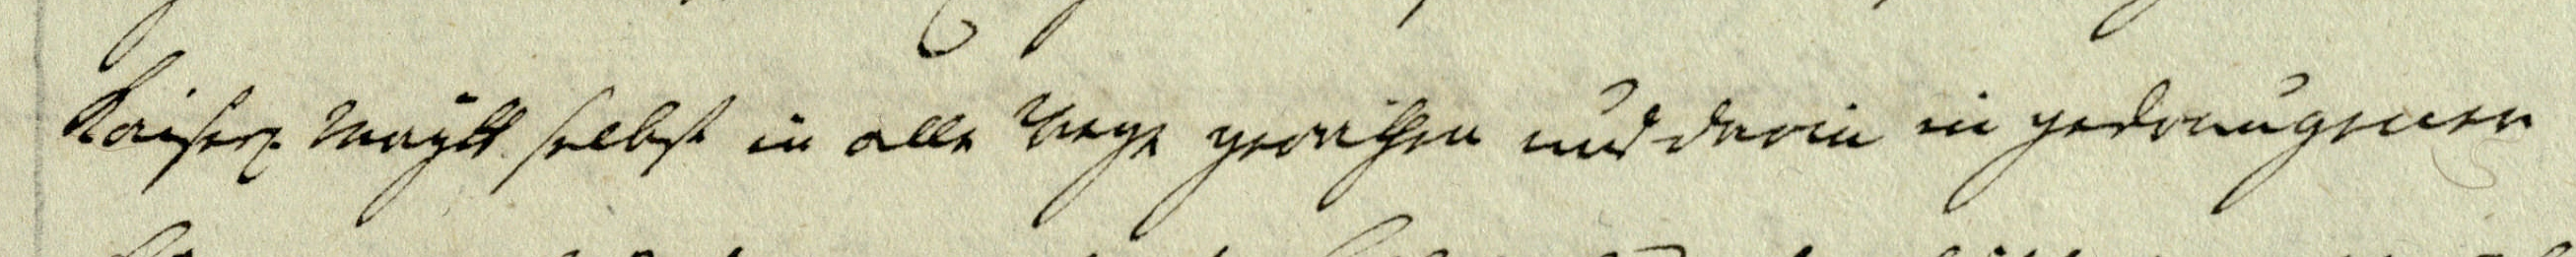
Kaiser. Maÿtt. selbst in alle Wege gerathen und darin in gedrungener
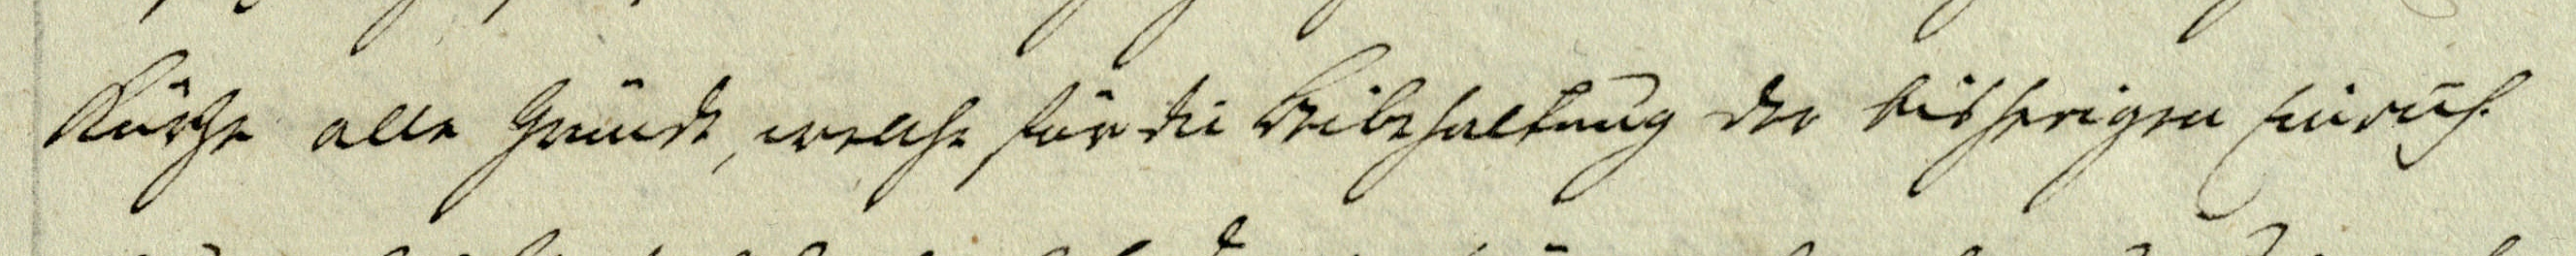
Kürze alle Gründe, welche für die Beibehaltung der bisherigen Einrich¬
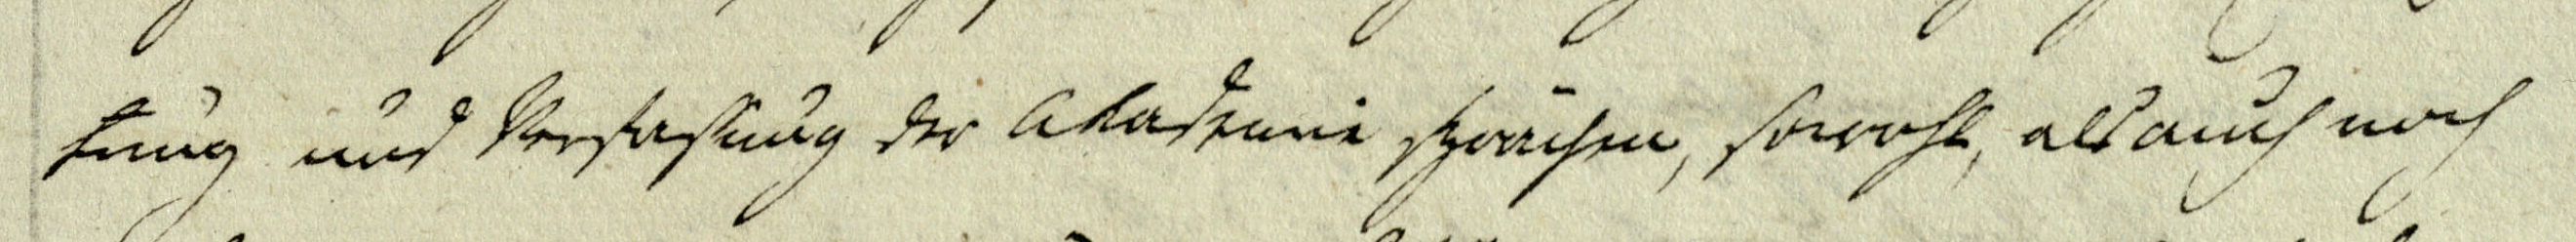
tung und Verfassung der Akademie sprächen, sowohl, als auch noch
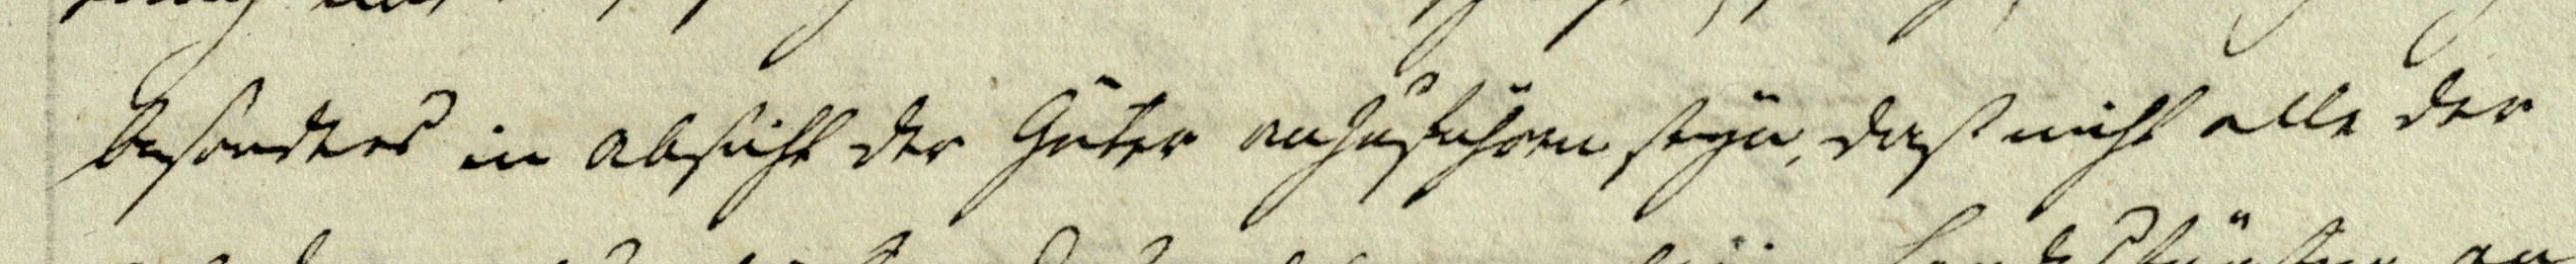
besonders in Absicht der Güter anzuführen seÿn, daß nicht alle der
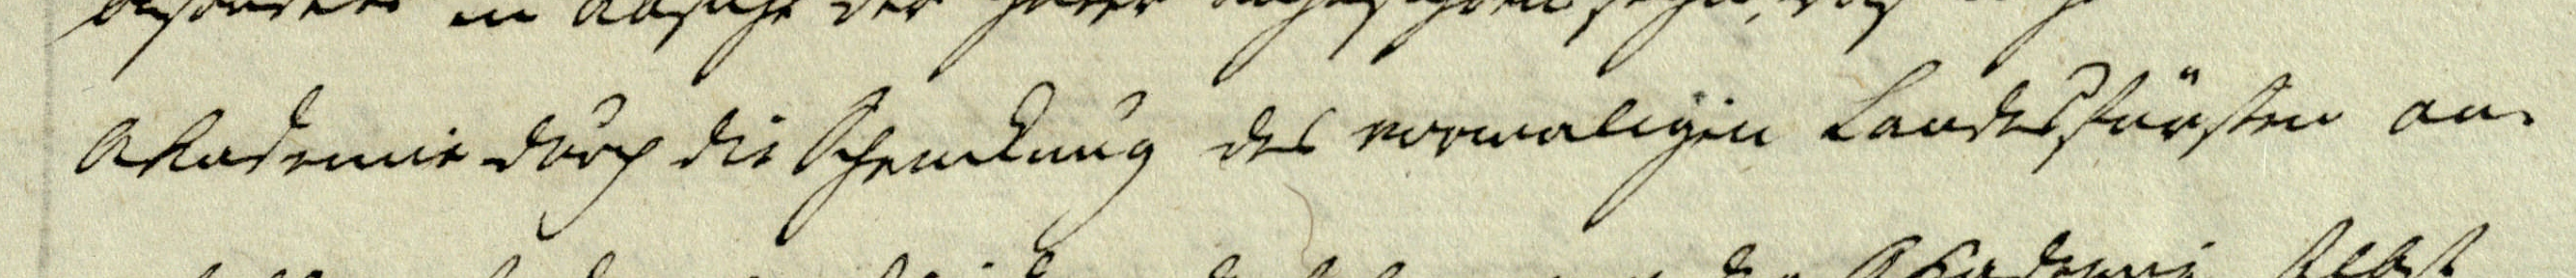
Akademie durch die Schenkung des vormaligen Landesfürsten an¬
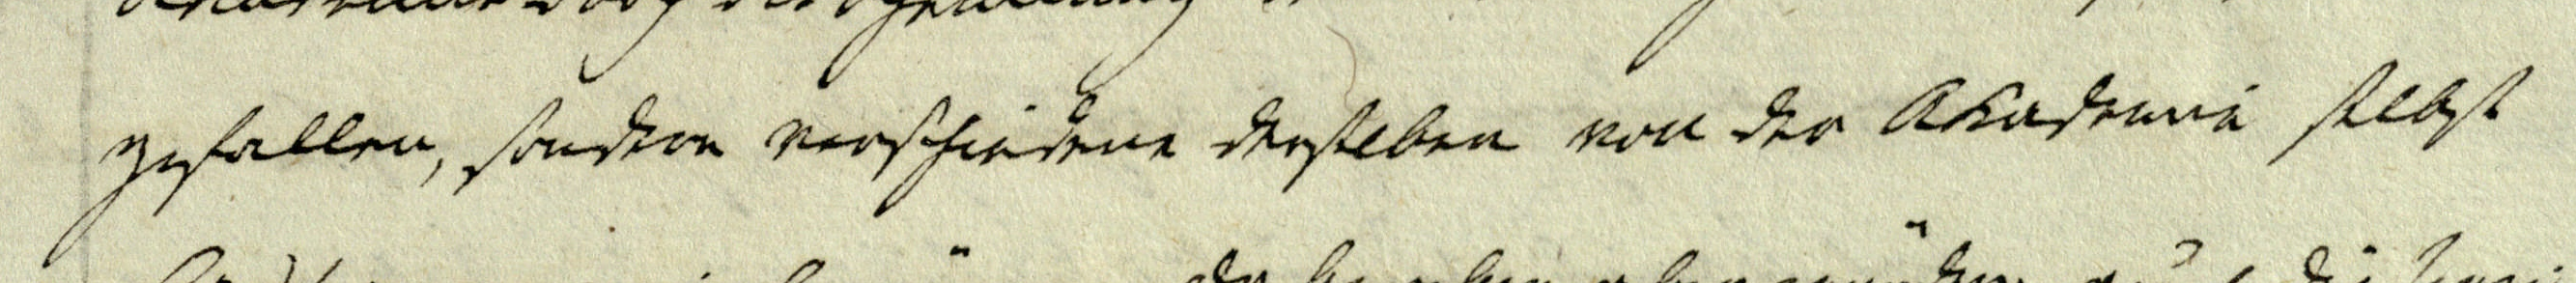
gefallen, sondern verschiedene derselben von der Akademie selbst
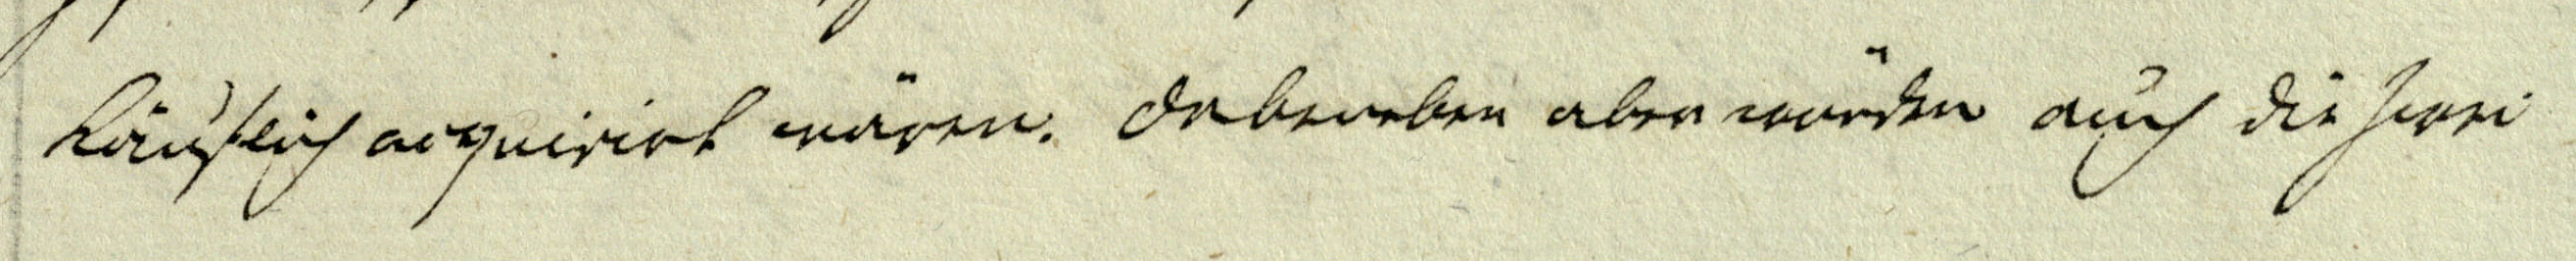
käuflich acquirirt wären. Dabeneben aber würden auch die zwei
